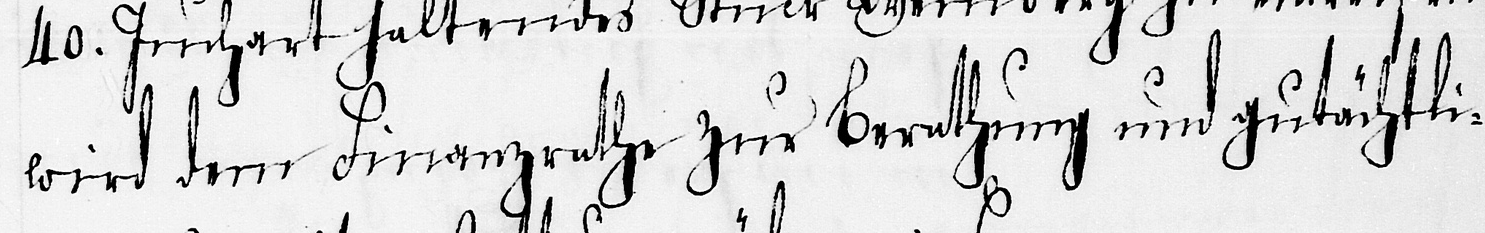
wird dem Finanzrathe zur Berathung und gutächtli¬
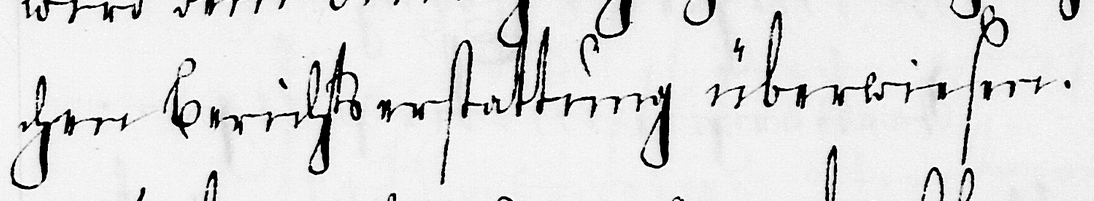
chen Berichtserstattung überwiesen.
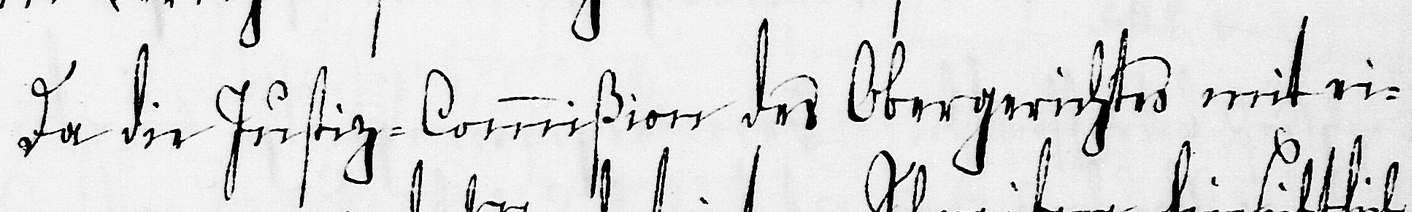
Da die Justiz-Commißion des Obergerichtes mit ei¬
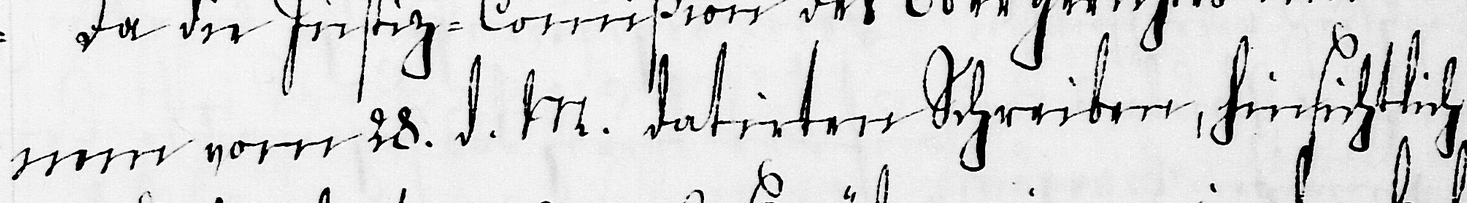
nem vom 28 d. M. datirten Schreiben, hinsichtlich
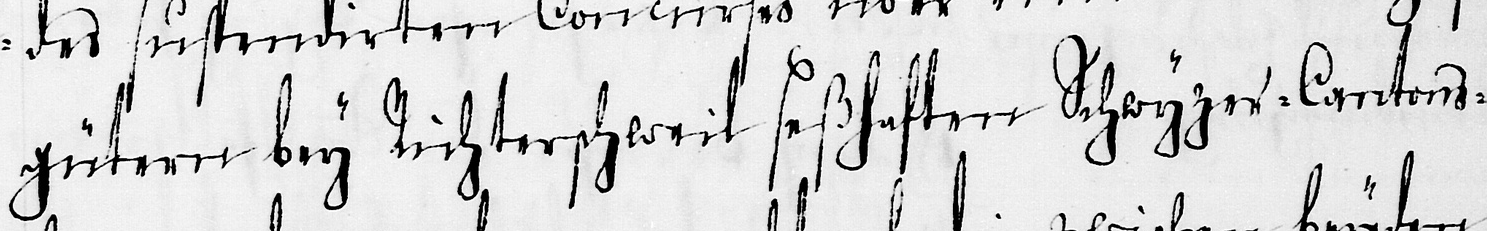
gütern bey Richterschweil seßhaften Schwyzer-Cantons¬
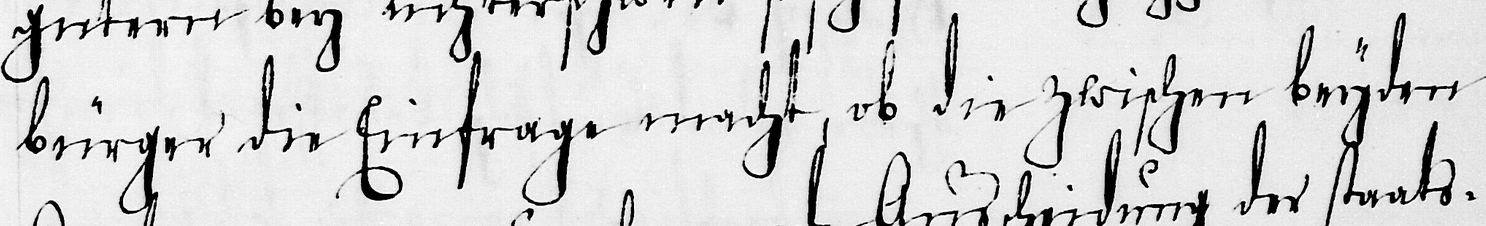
bürger die Einfrage macht, ob die zwischen beyden
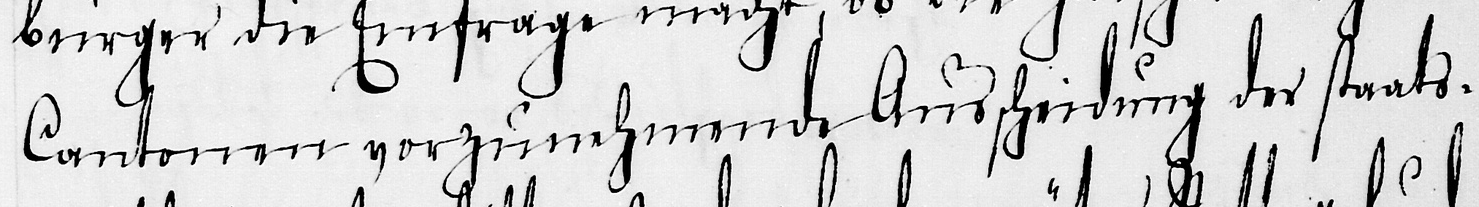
Cantonen vorzunehmende Ausscheidung der staats¬
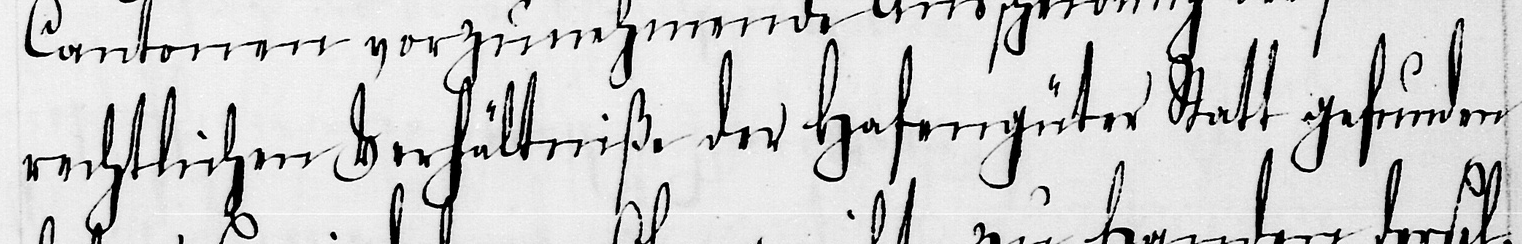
rechtlichen Verhältniße der Hafengüter Statt gefunden
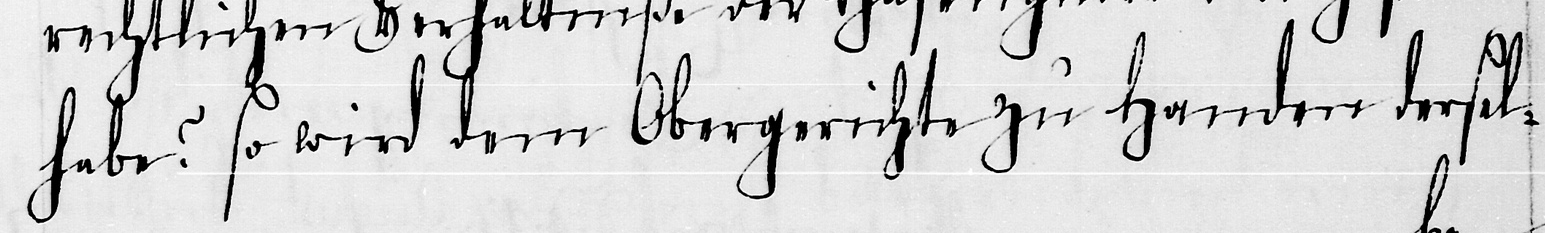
habe? so wird dem Obergerichte zu Handen dersel-
